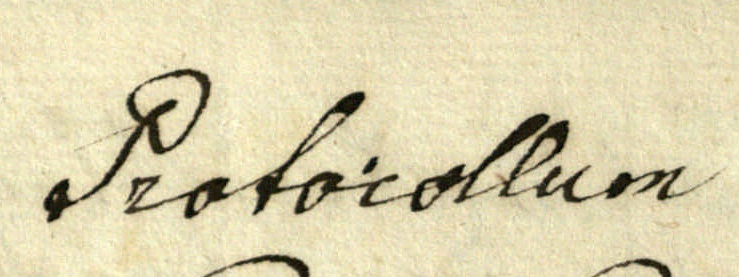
Protocollum
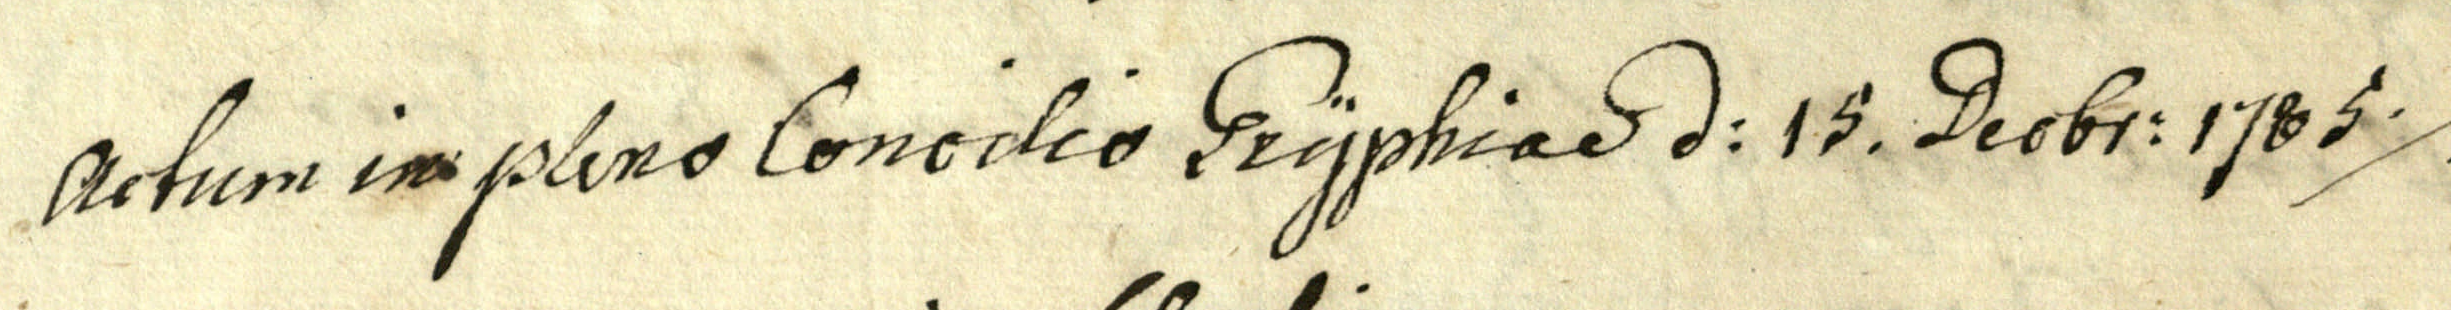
Actum in pleno Concilio Grÿphiae d. 15. Decbr. 1785.
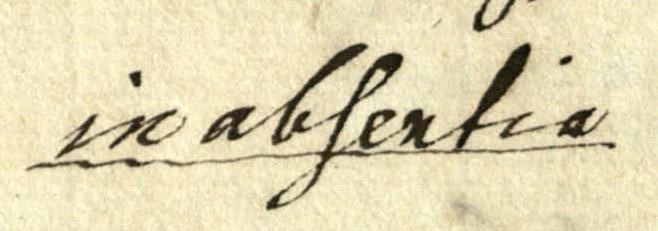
in absentia
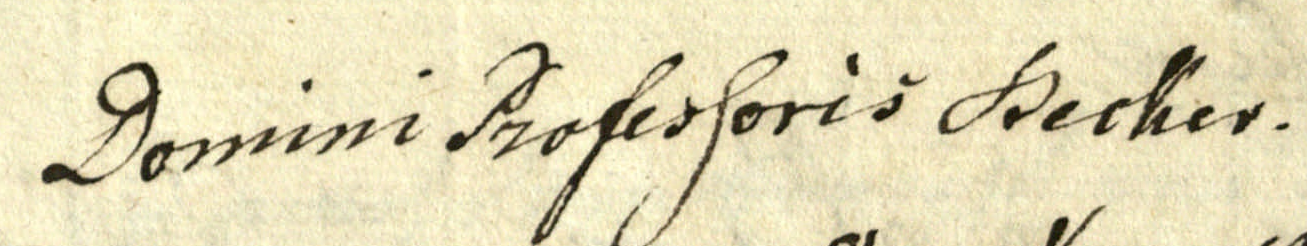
Domini Professoris Becker.
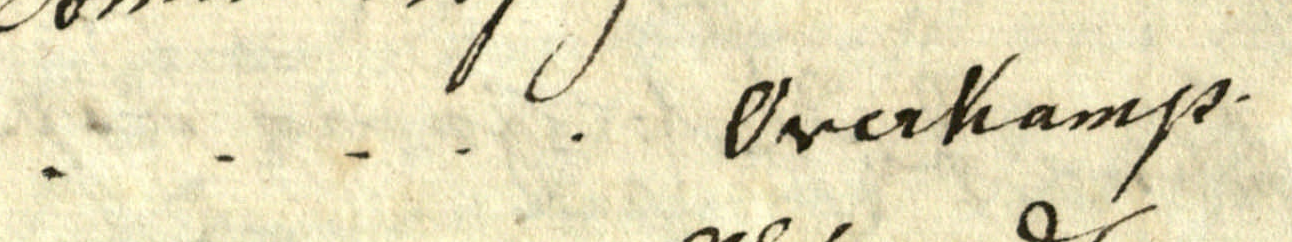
Overkamp.
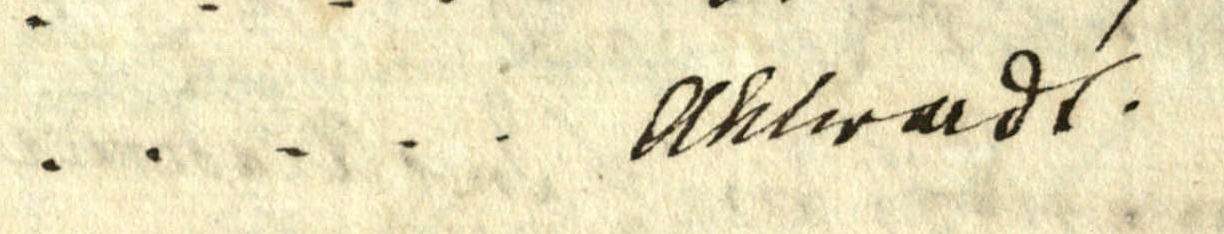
Ahlwardt.
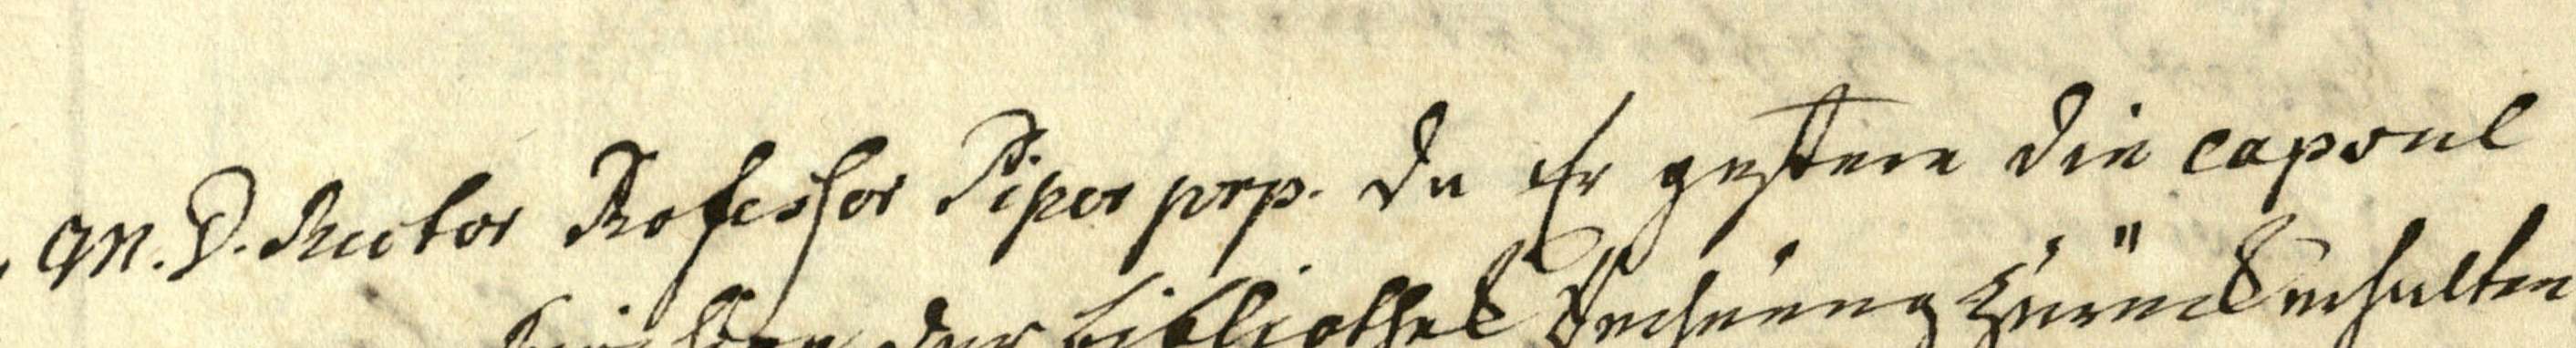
1. M. D. Rector Professor Piper prp. Da Er gestern die capsul
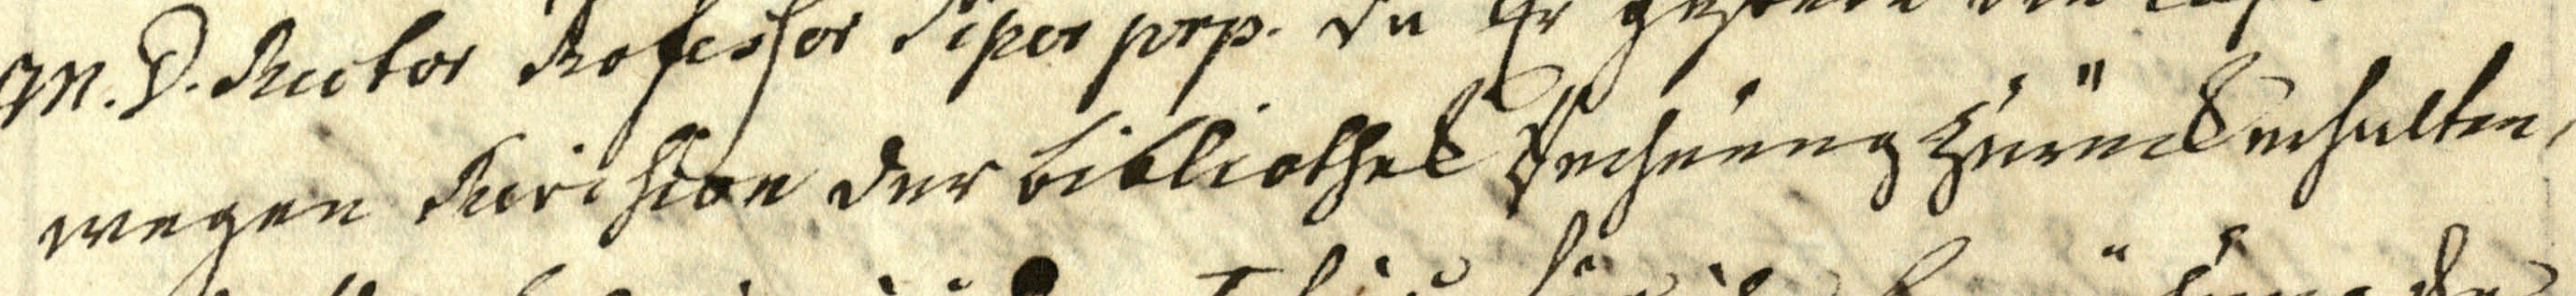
wegen Revision der Bibliothek Rechnung zurückerhalten,
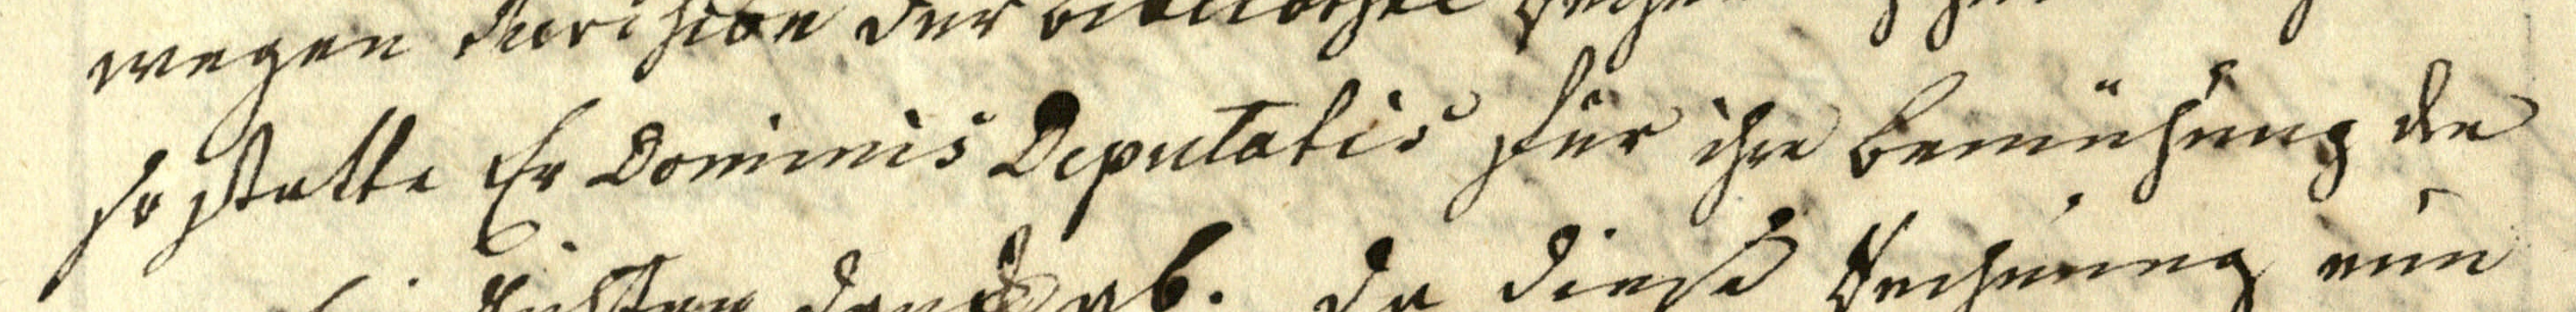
so statte Er Dominis Deputatis er ihre Bemühung den
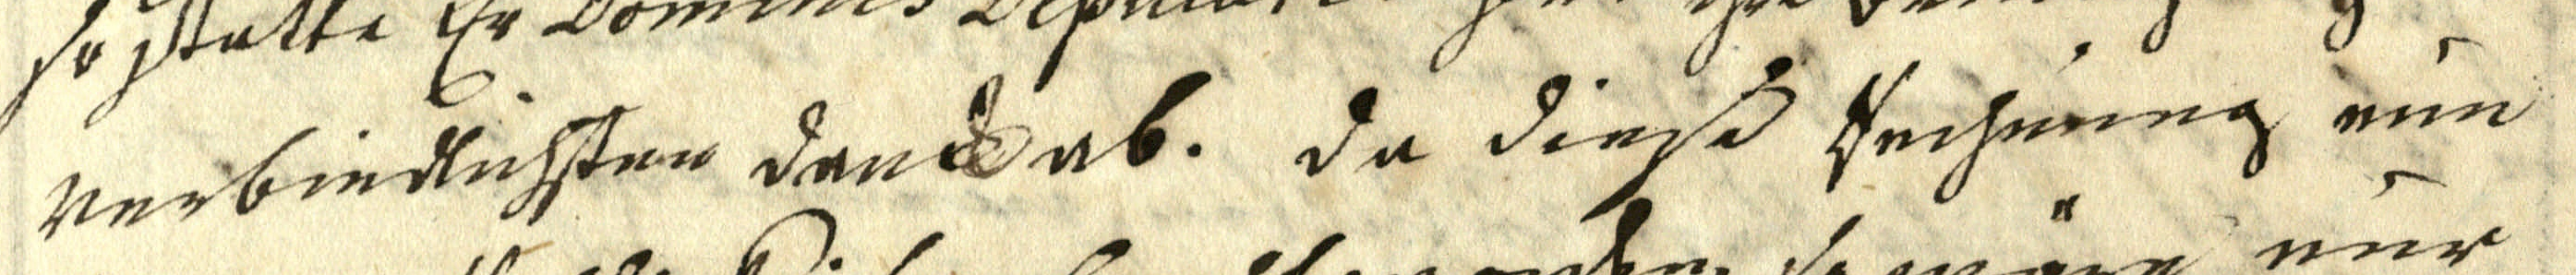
verbindlichsten danck ab. da diese Rechnung nun
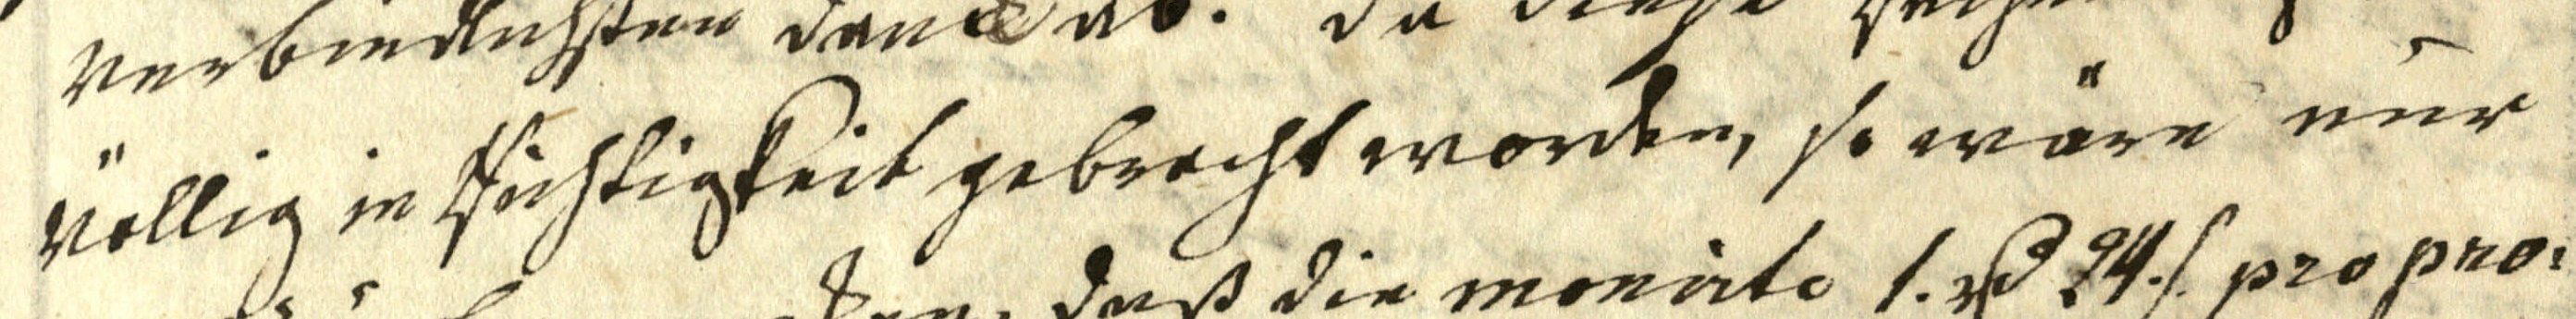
völlig in Richtigkeit gebracht worden, so wäre nur
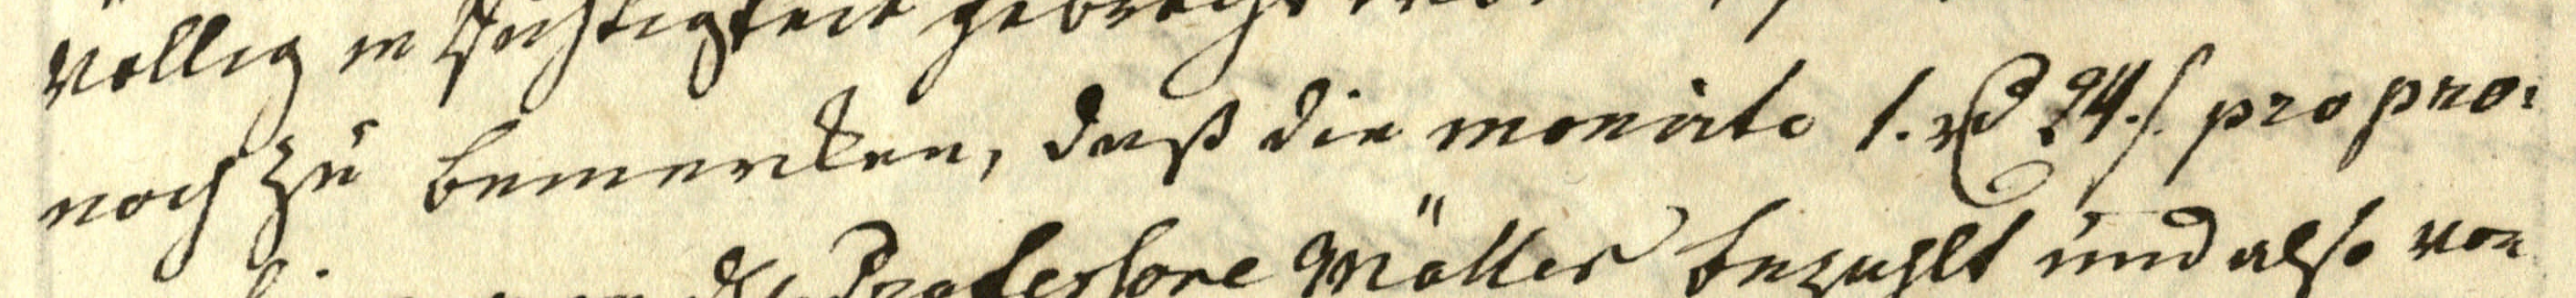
noch zu bemercken, daß die monirte 1. rt 24. s. pro pro¬
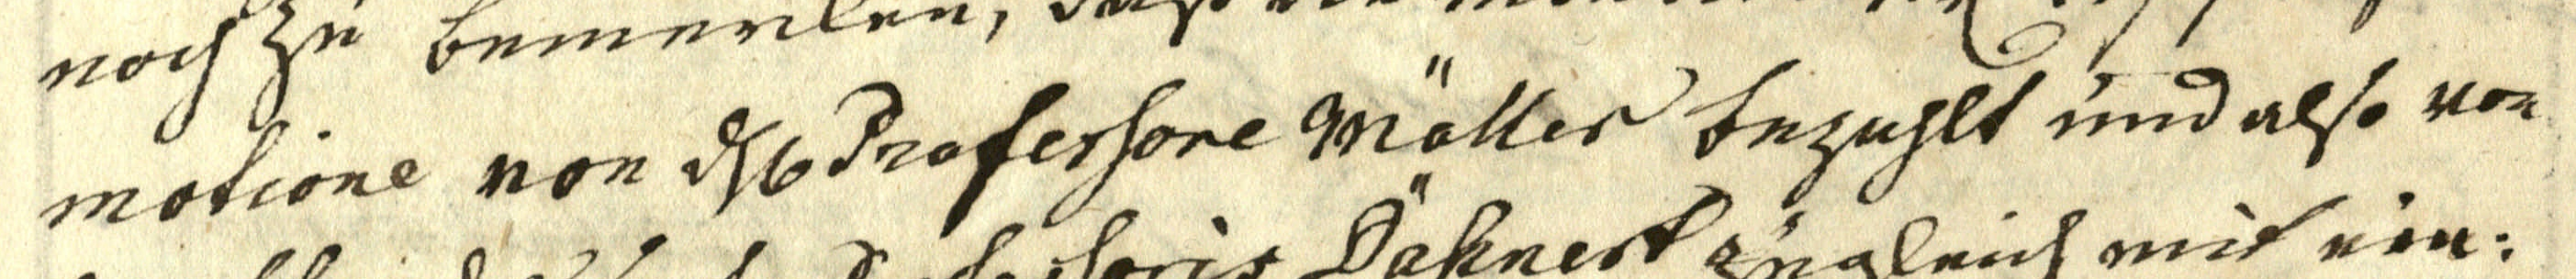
motione von dh. Professore Möller bezahlt und also von
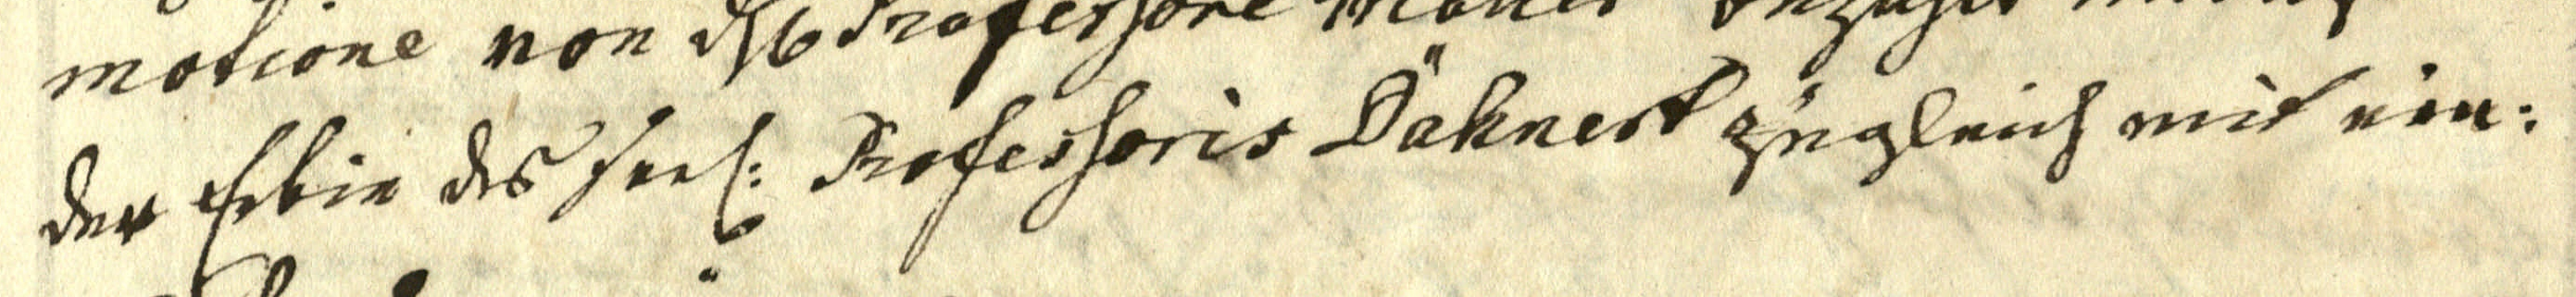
der Erbin des seel. Professoris Dähnert zugleich mit ein¬
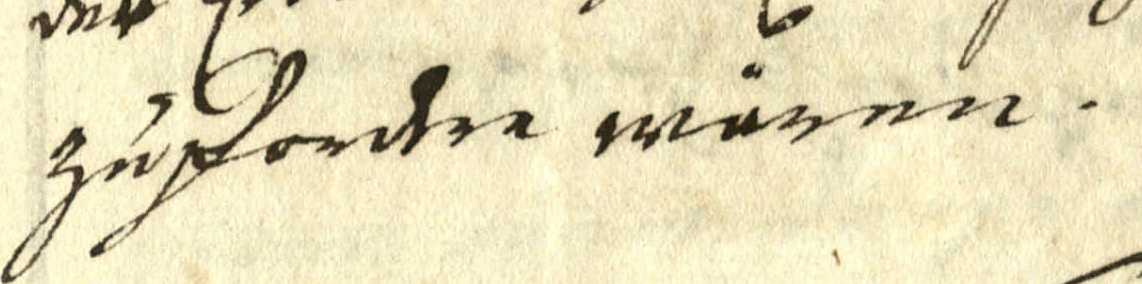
zufordern wären.
